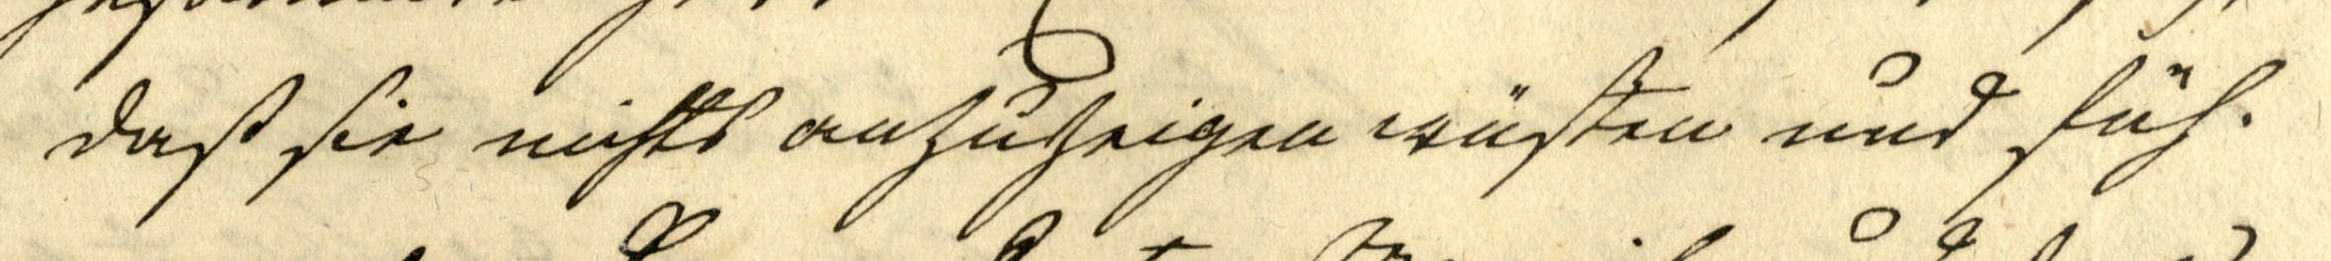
daß sie nichts anzuzeigen wüßten und füh¬
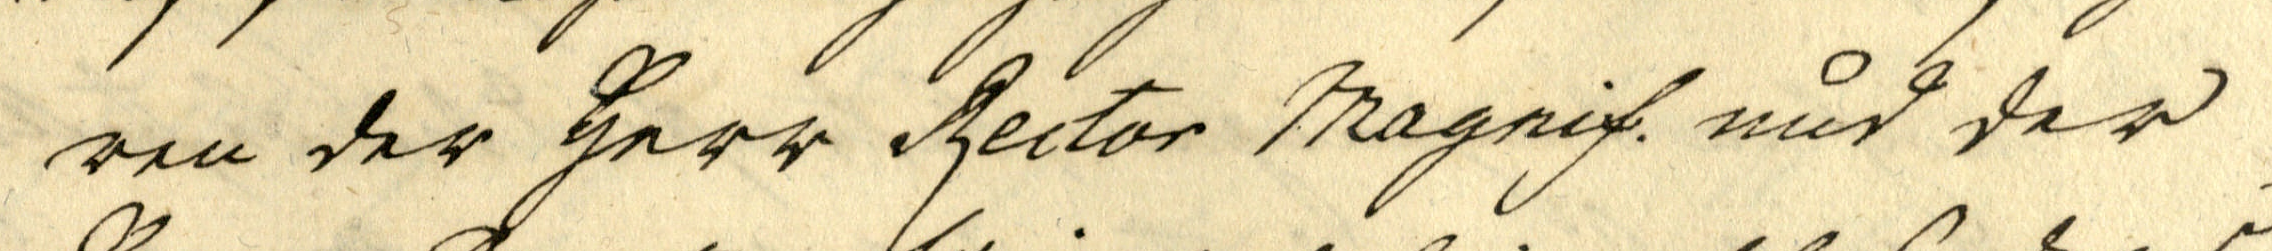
ren der Herr Rector Magnif. und der
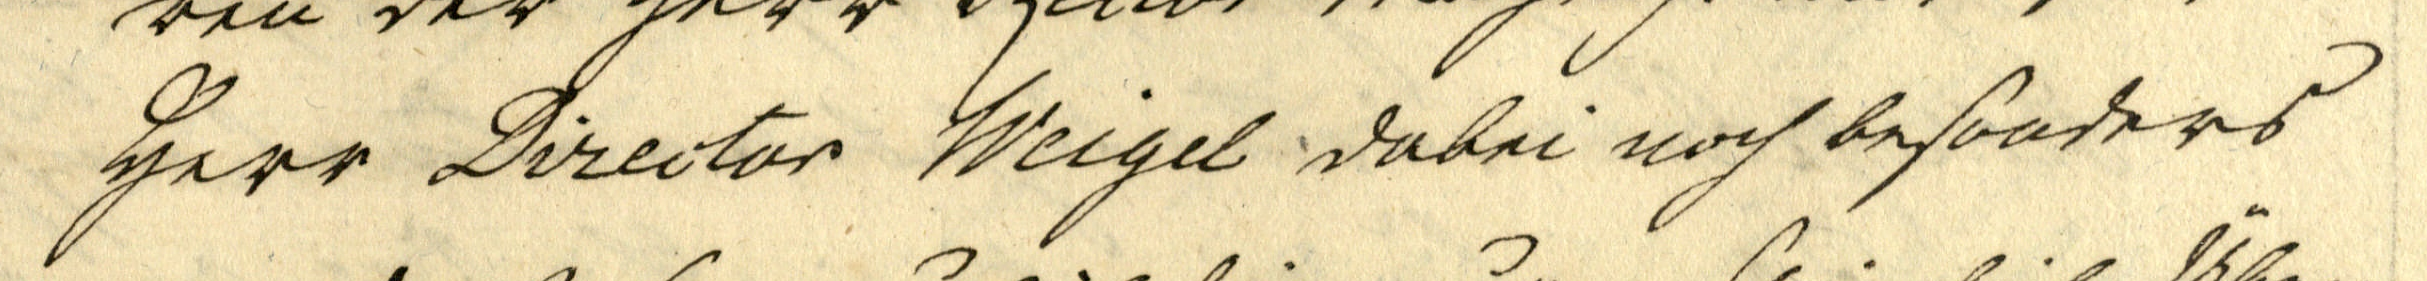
Herr Director Weigel dabei noch besonders
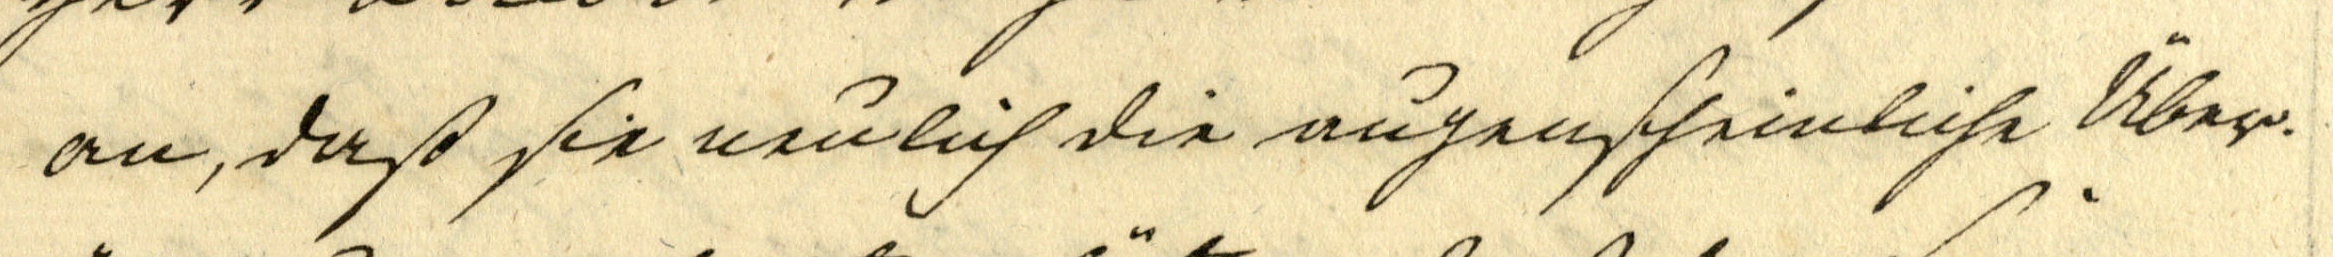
an, daß sie nemlich die augenscheinliche Über¬
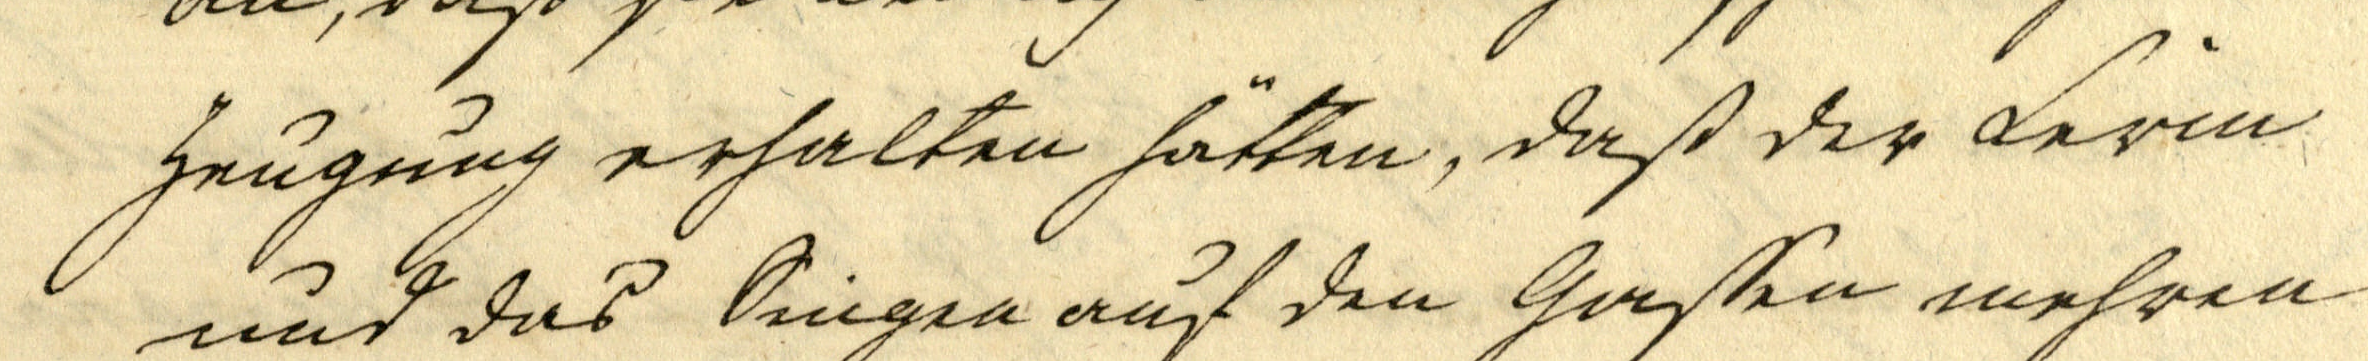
zeugung erhalten hätten, daß der Lerm
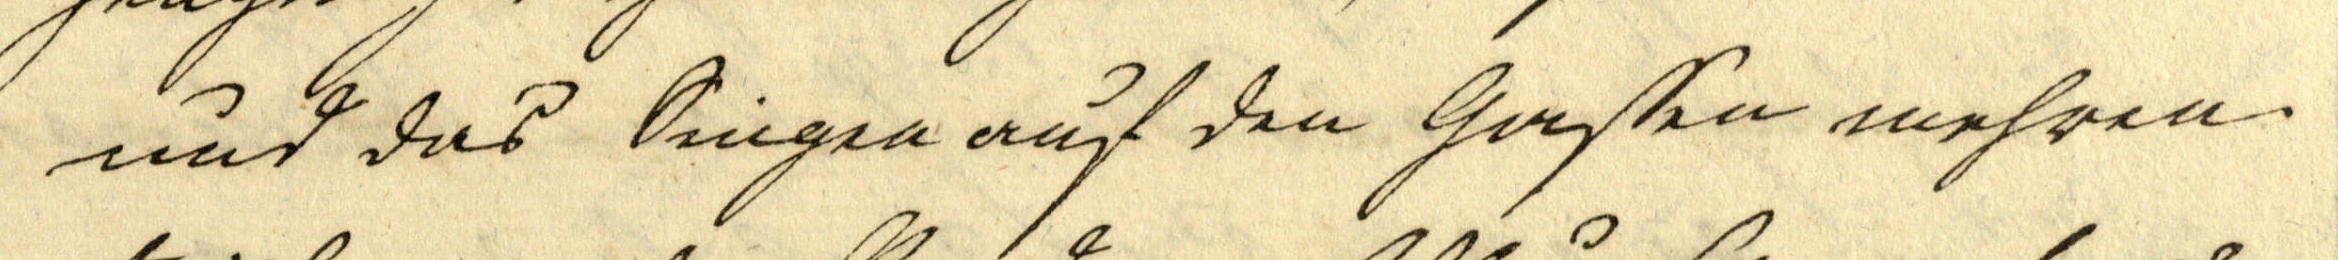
und das Singen auf den Gassen mehren¬
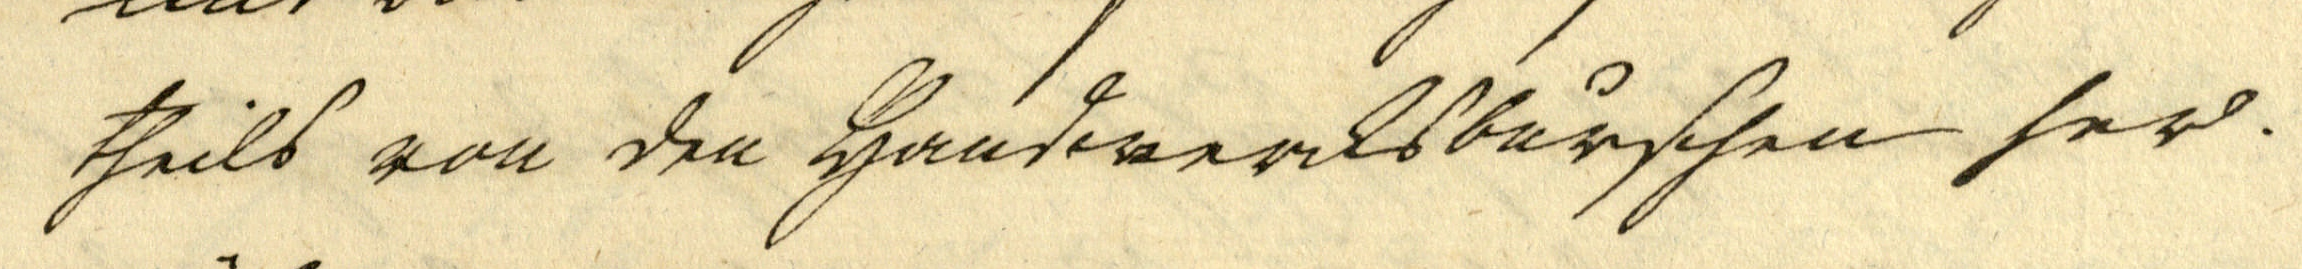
theils von den Handwerksburschen her¬
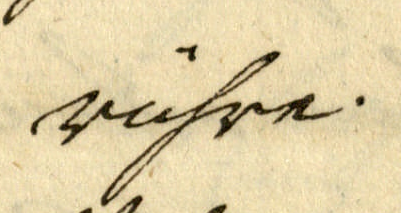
rühre.
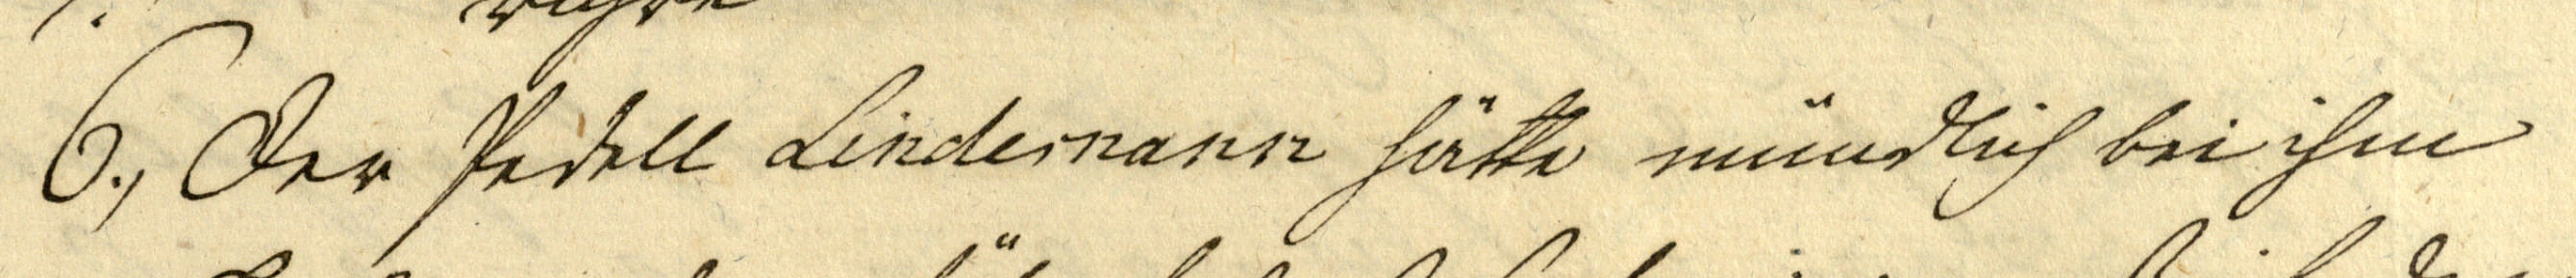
6., Der Pedell Lindemann hätte mündlich bei ihm
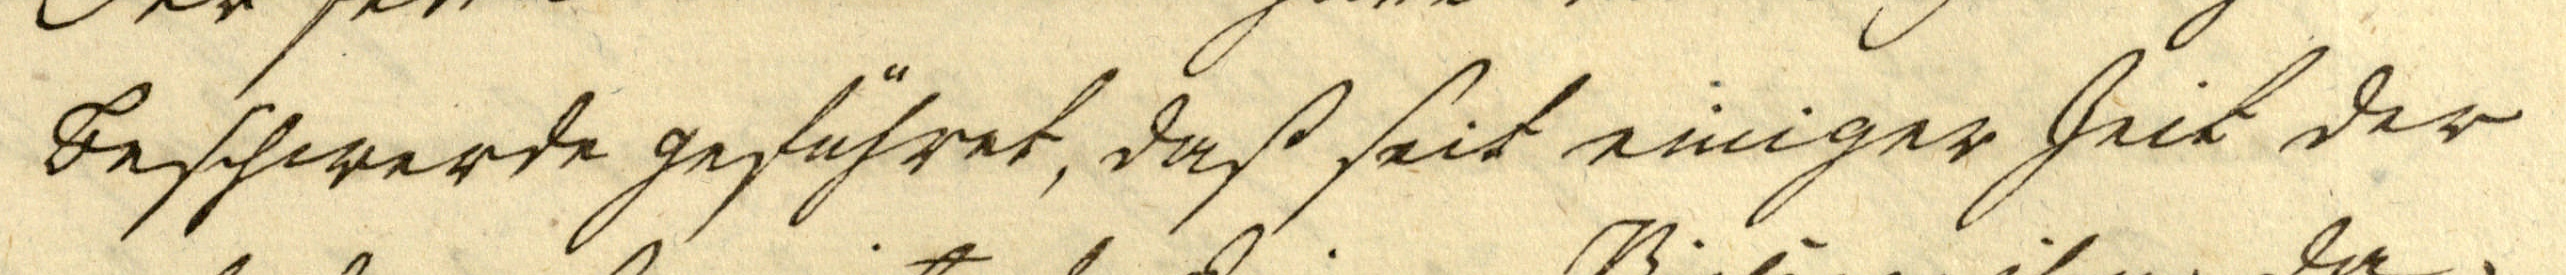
Beschwerde geführet, daß seit einiger Zeit der
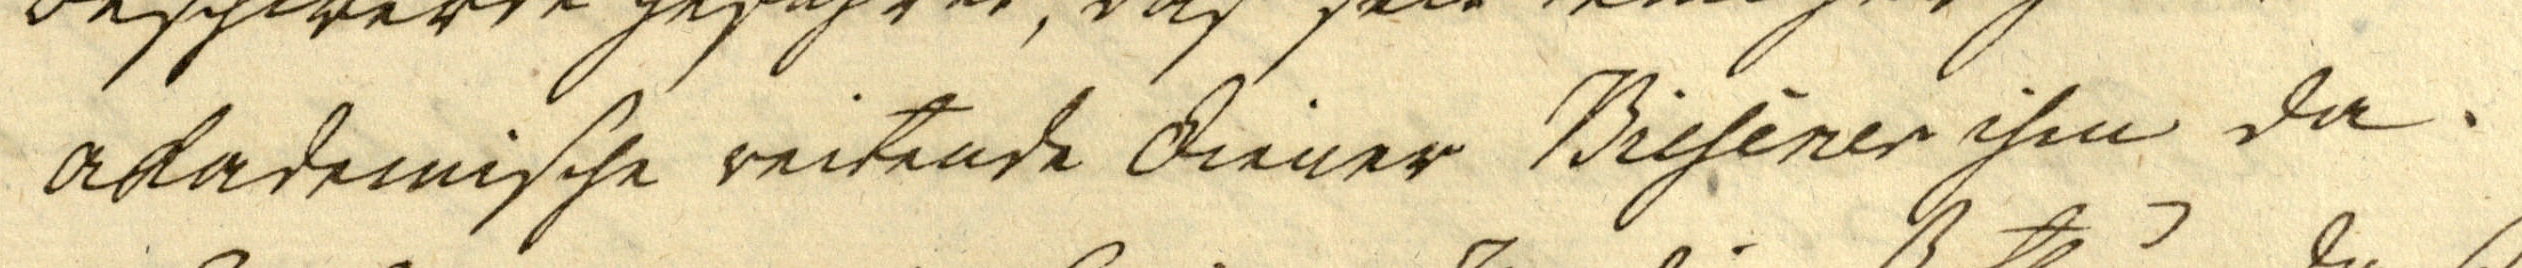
akademische reitende Diener Biesener ihm da¬
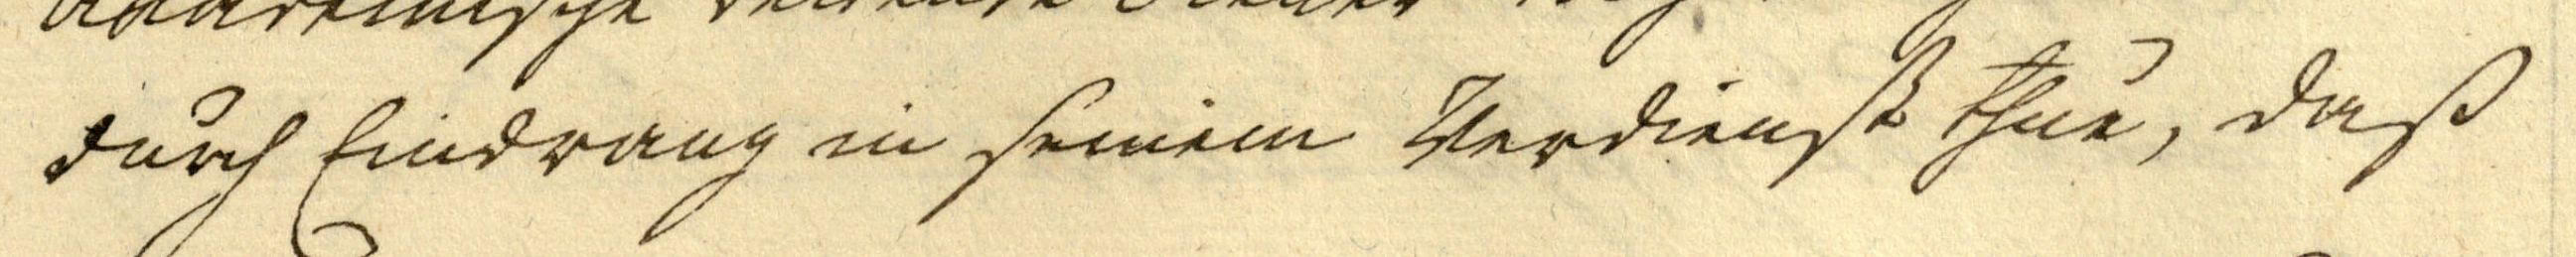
durch Eindrang in seinem Verdienst thue, daß
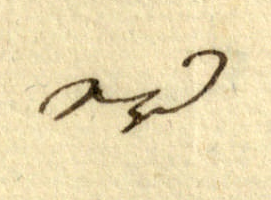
er
